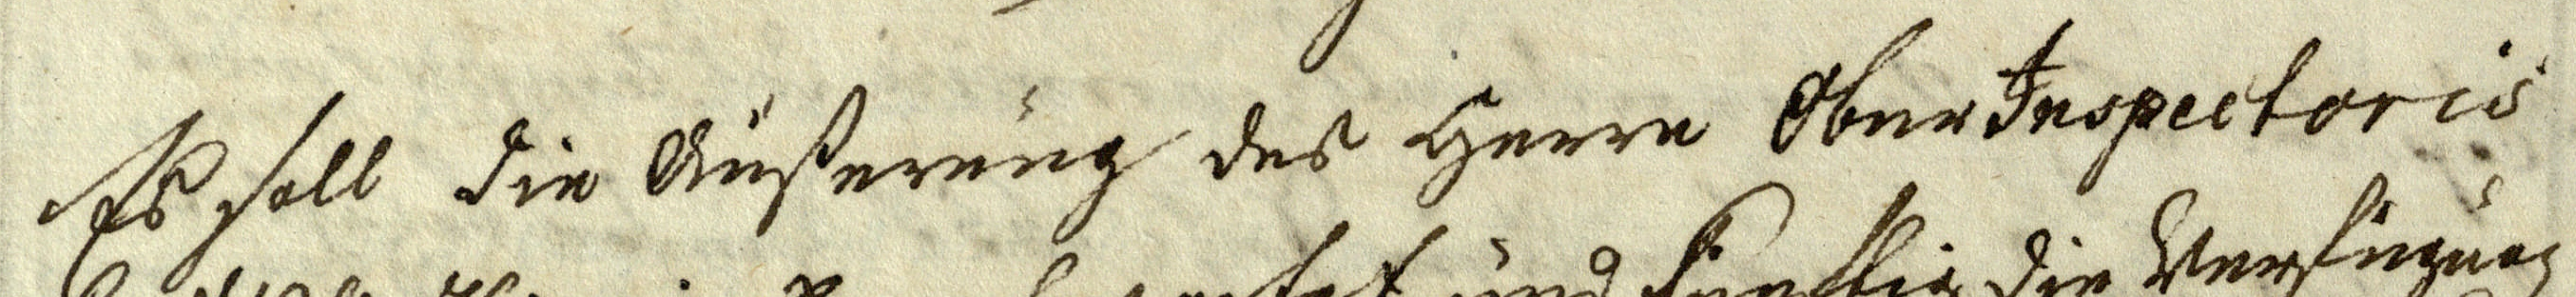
es soll die Äußerung des Herrn Ober Inspectoris
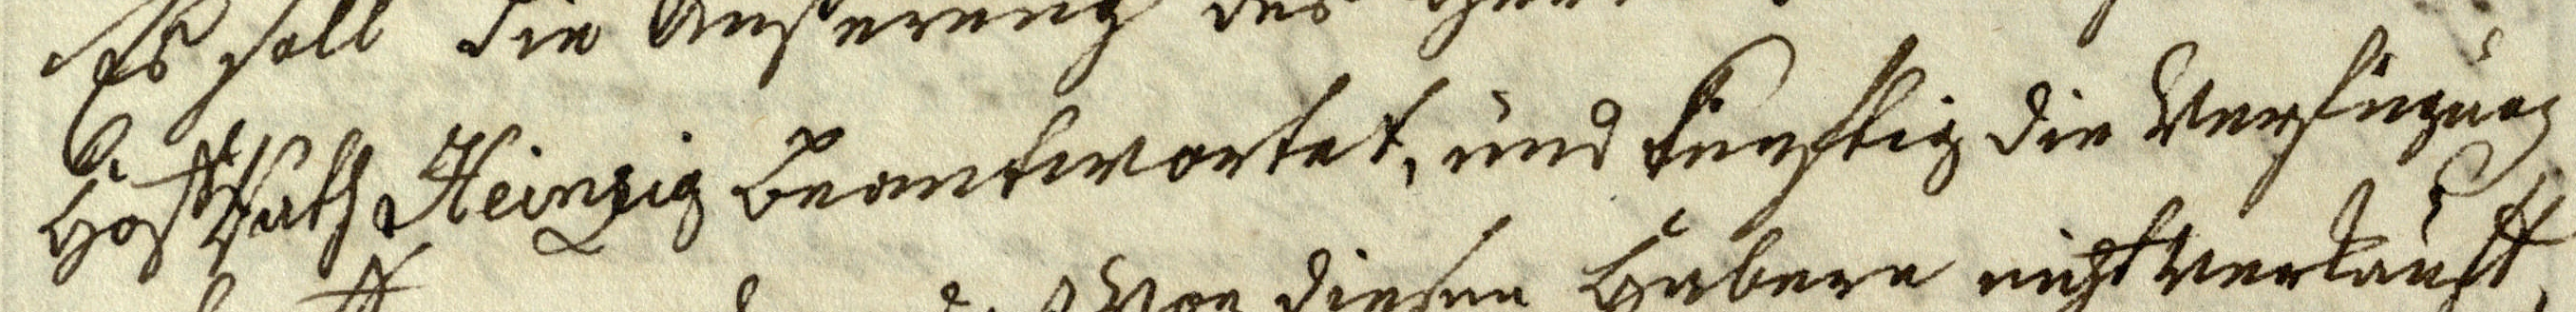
HofRath Heinzig beantwortet und künftig die Verfügung
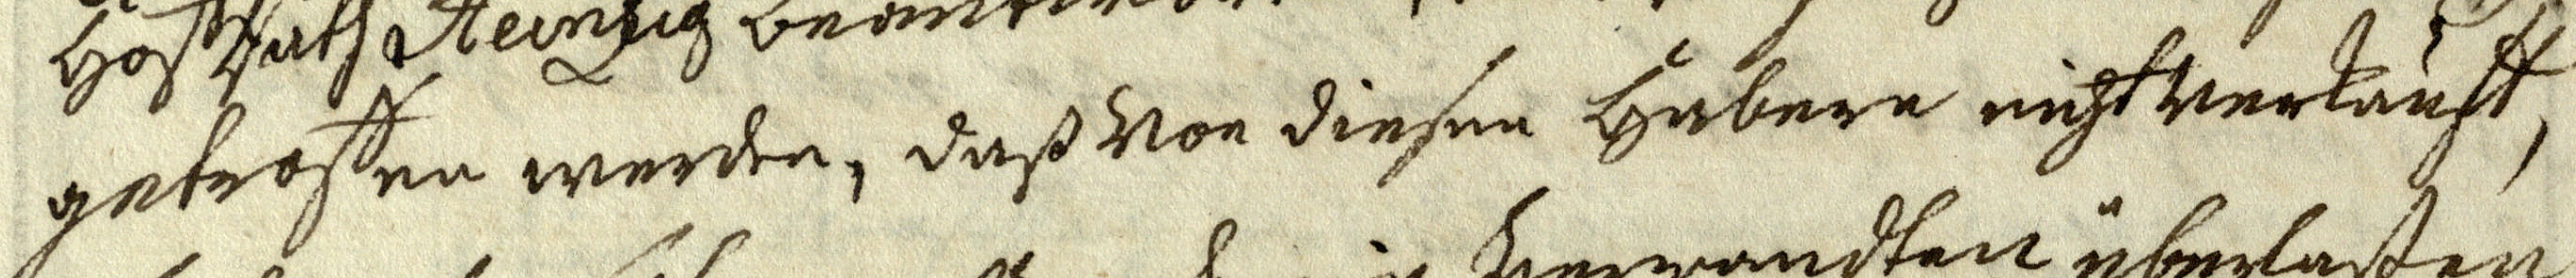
getroffen werden, daß von diesem Habern nicht verkauft,
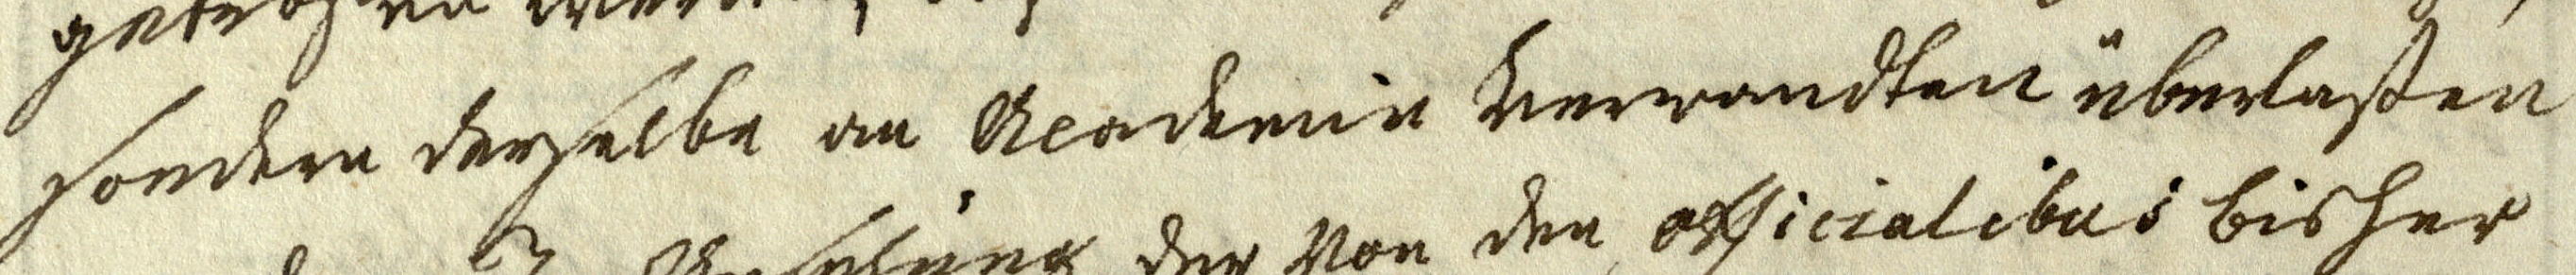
sondern derselbe an Academie Verwandten überlaßen
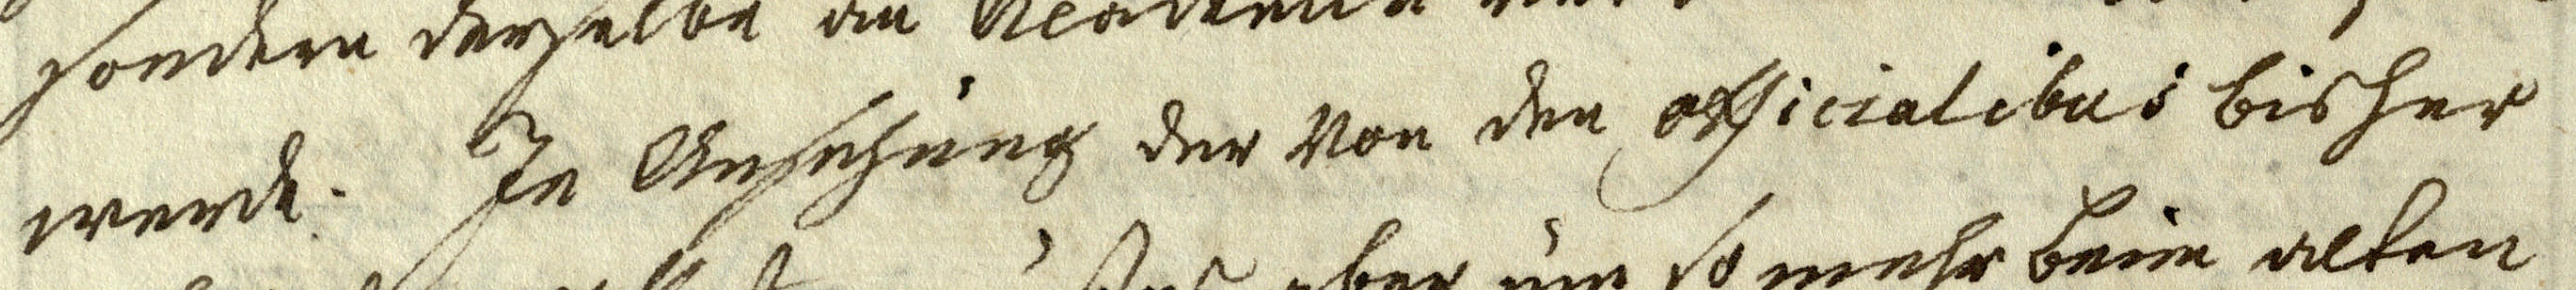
werde. In Ansehung der von dem officialibus bisher
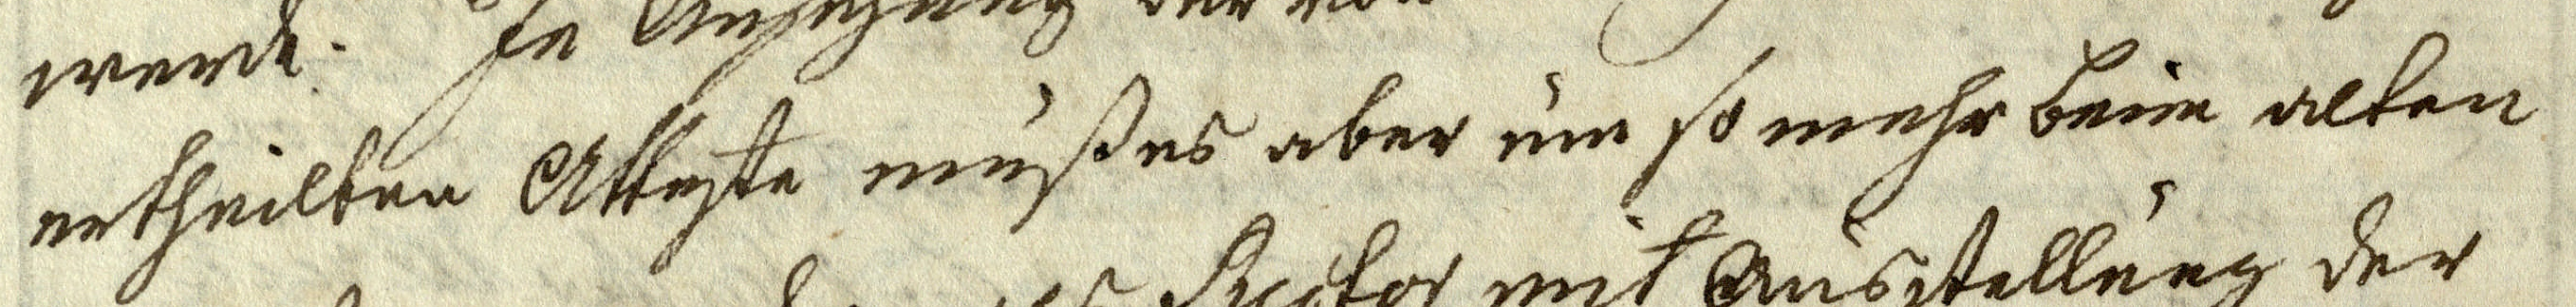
ertheilten Atteste muß es aber um so mehr beim alten
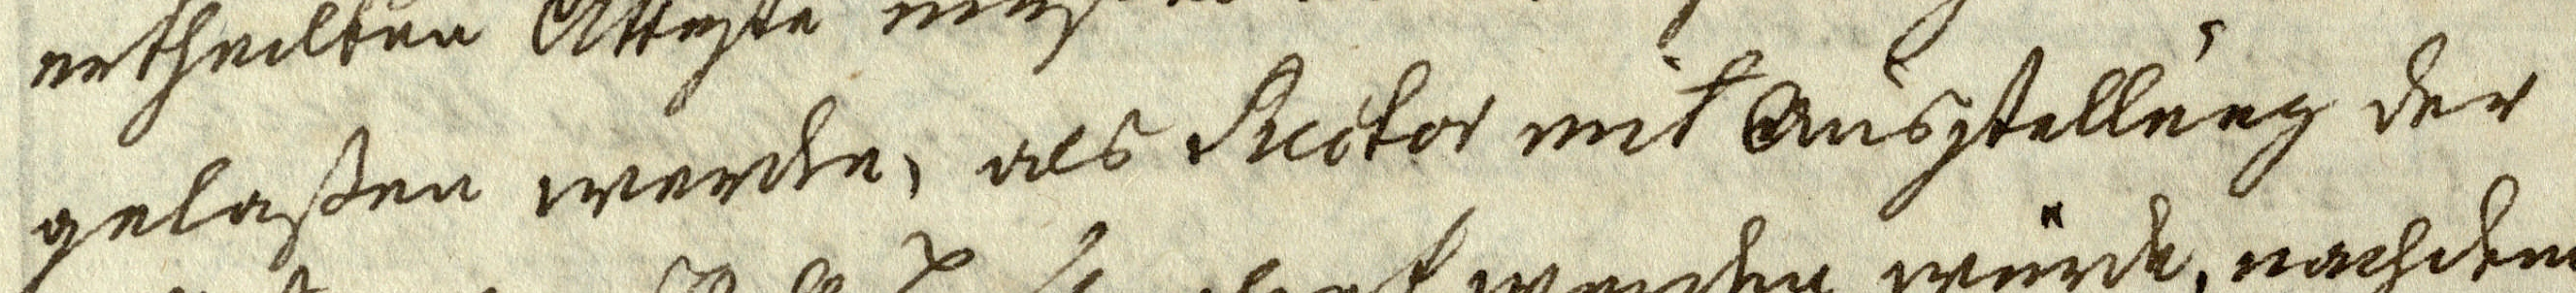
gelaßen werden, als Rector mit Ausstellung der
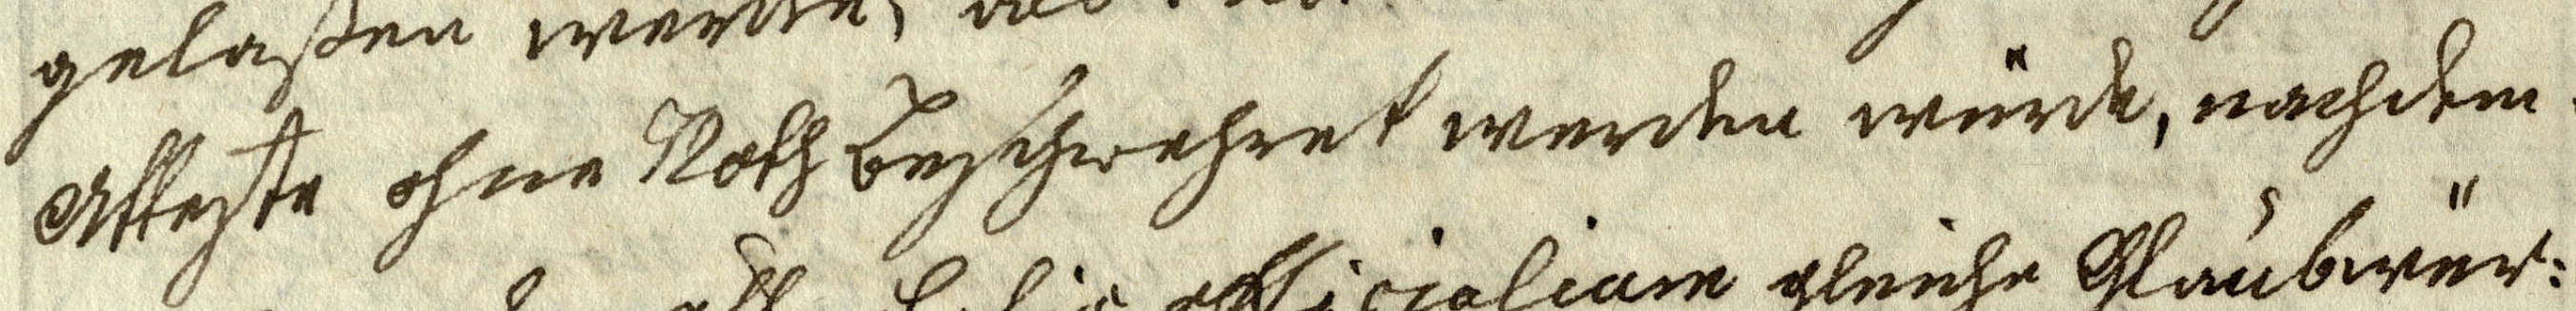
Atteste ohne Noth beschwehret werden würde, nachdem¬
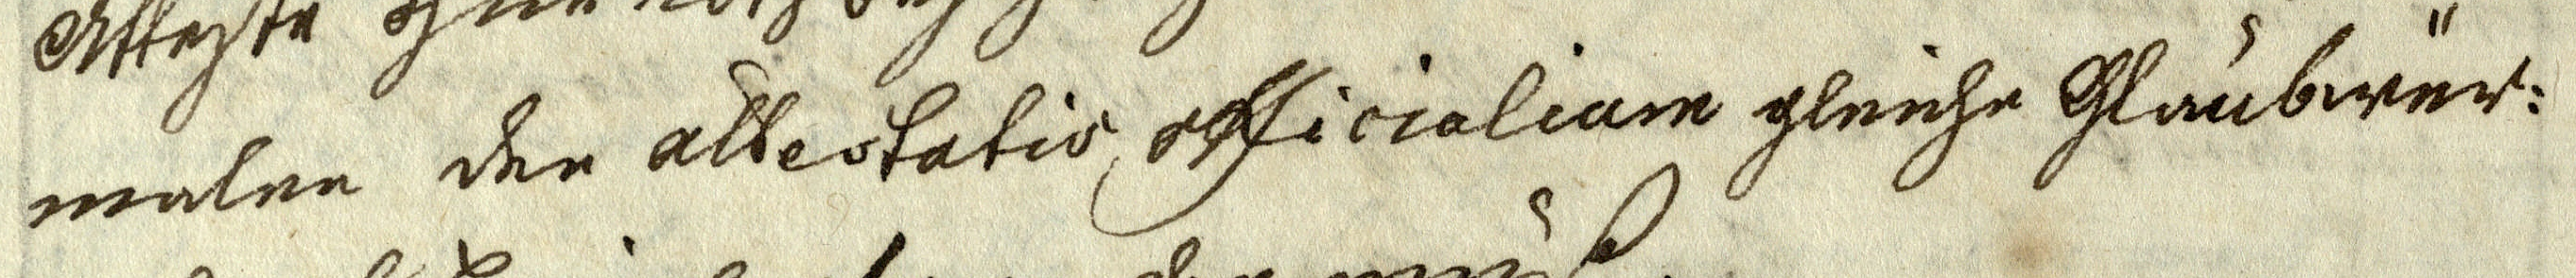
malen den attestatis officialium gleiche Glaubwür¬
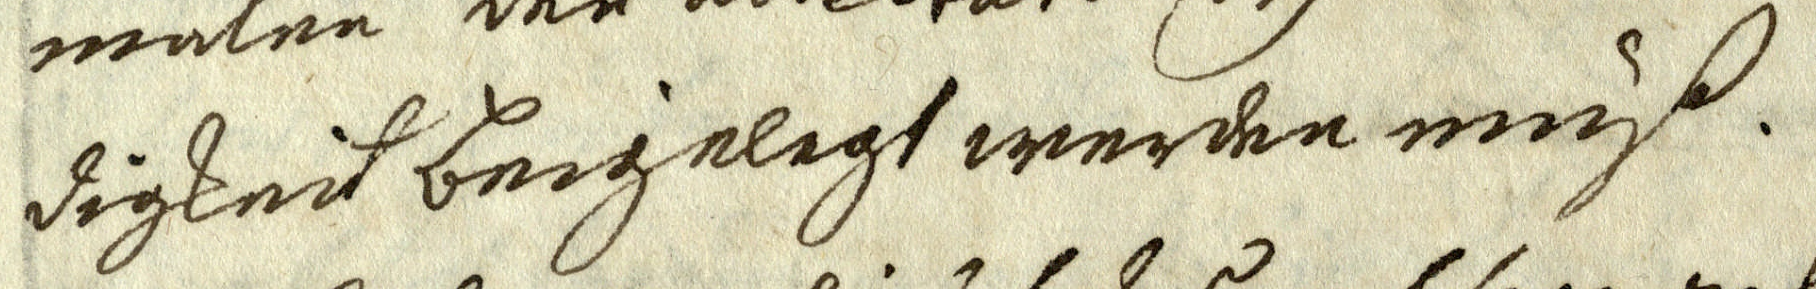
digkeit beigelegt werden muß.
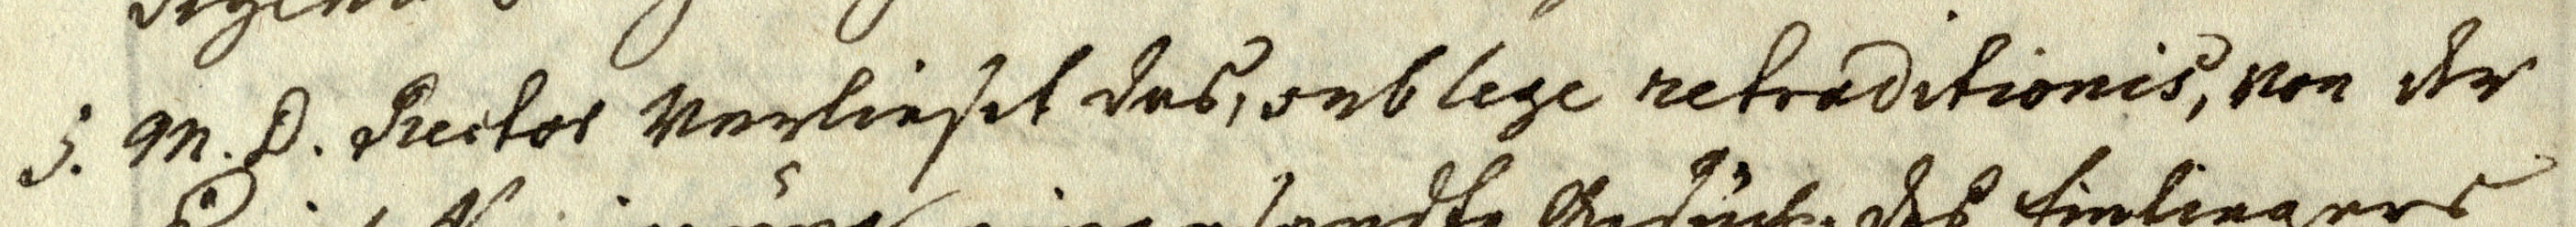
5. M. D. Rector verlieset das, sub lege retraditionis, von der
